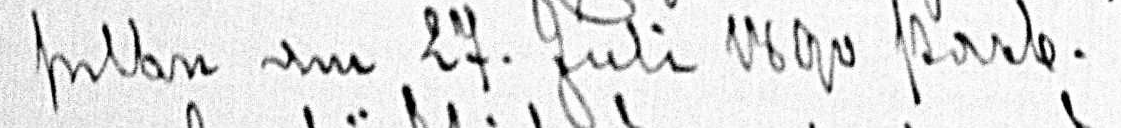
selbe am 27. Juli 1890 starb.
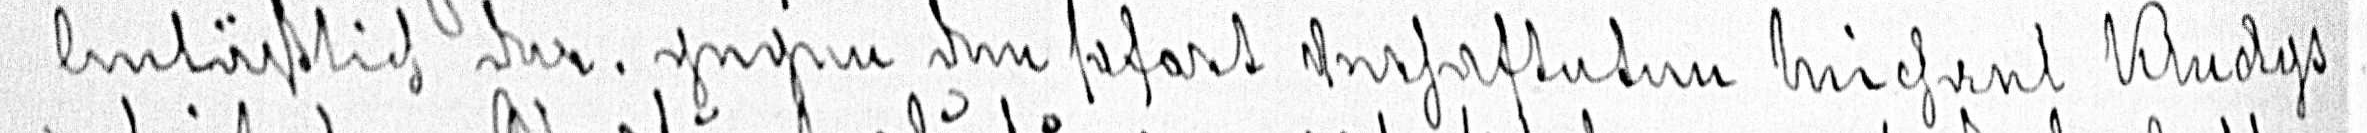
Anläßlich der gegen den sofort verhafteten Michael Kludys
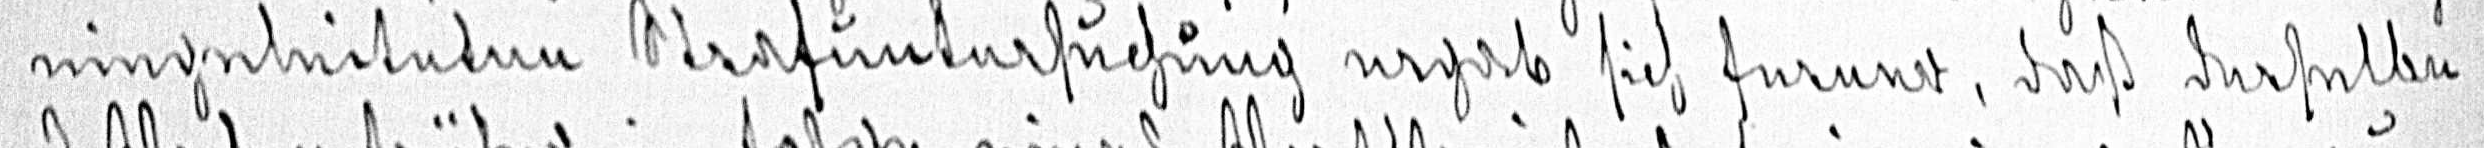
eingeleiteten Strafuntersuchung ergab sich ferner, daß derselbe
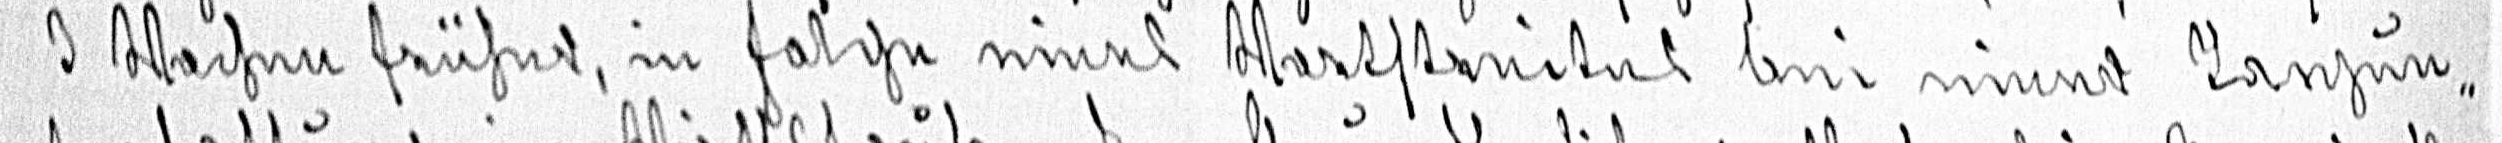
3 Wochen früher, in Folge eines Wortstreites bei einer Tanzun¬
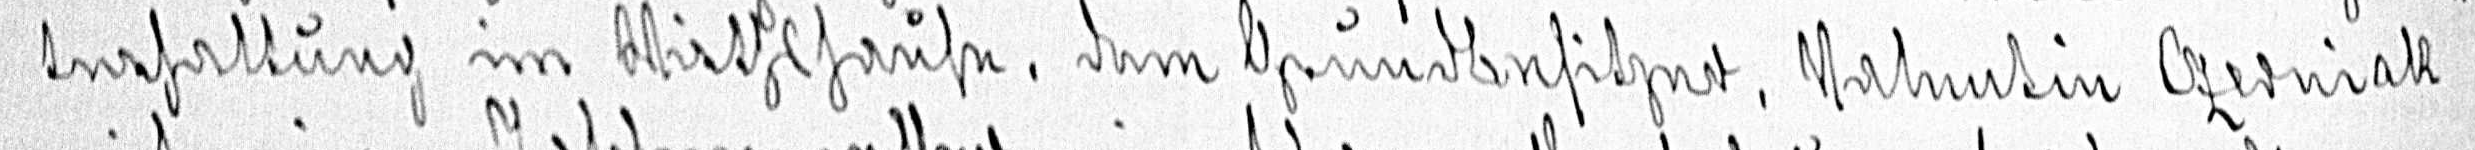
terhaltung im Wirtshause, dem Grundbesitzer, Valentin Czedniak
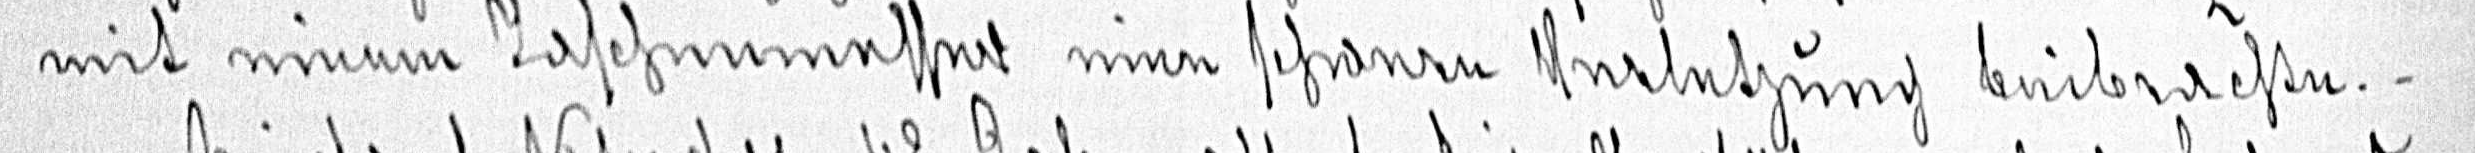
mit einem Taschenmesser eine schwere Verletzung beibrachte.
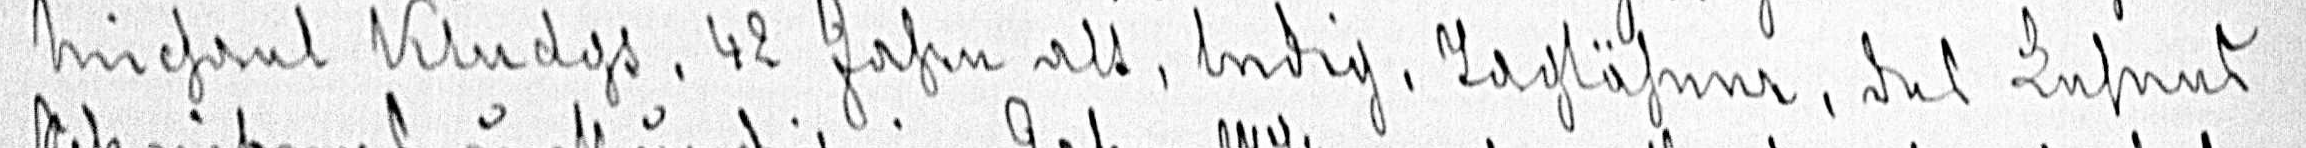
Michael Kludys, 42 Jahre alt, ledig, Taglöhner, des Lesens
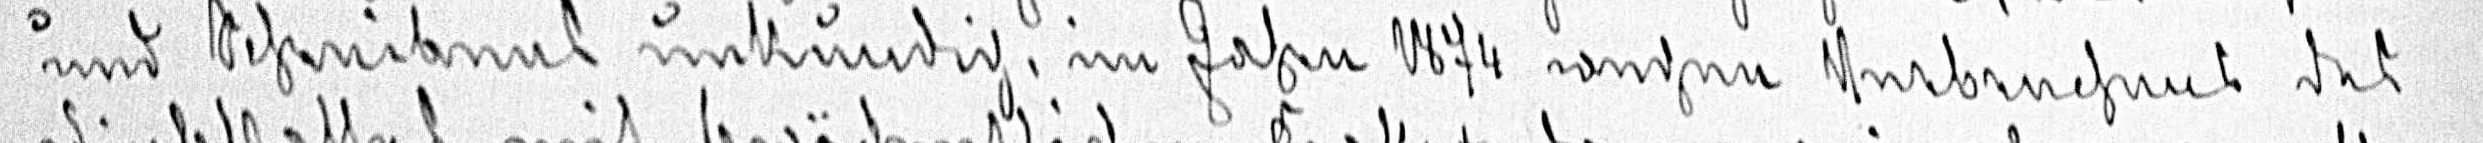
und Schreibens unkundig, im Jahre 1874 wegen Verbrechens des
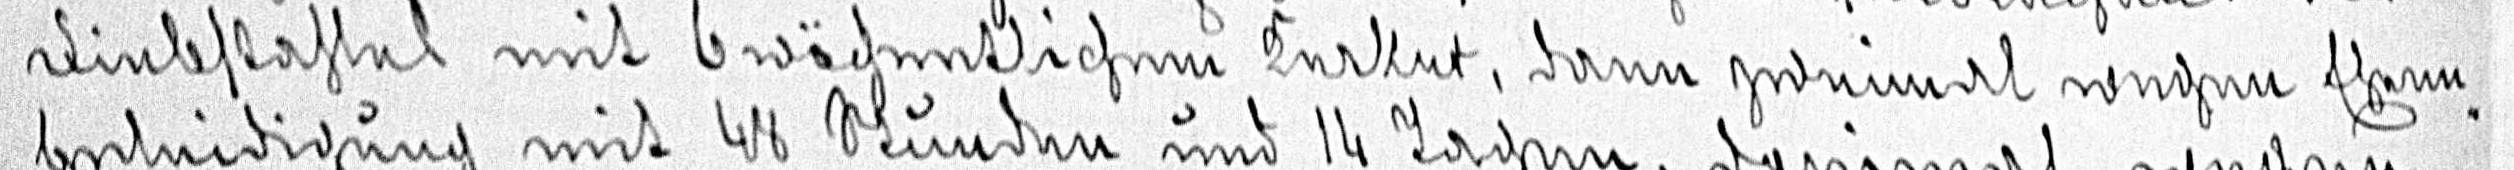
Diebstahles mit 6wöchentlichen Kerker, dann zweimal wegen Ehren¬
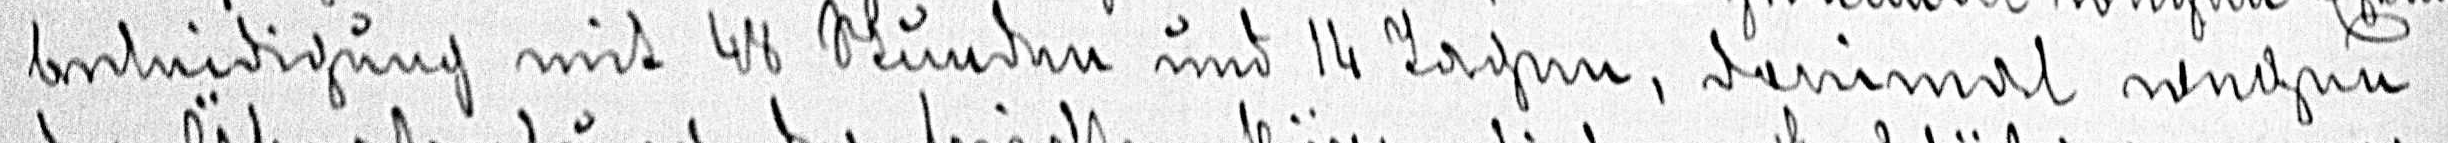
beleidigung mit 48 Stunden und 14 Tagen, dreimal wegen
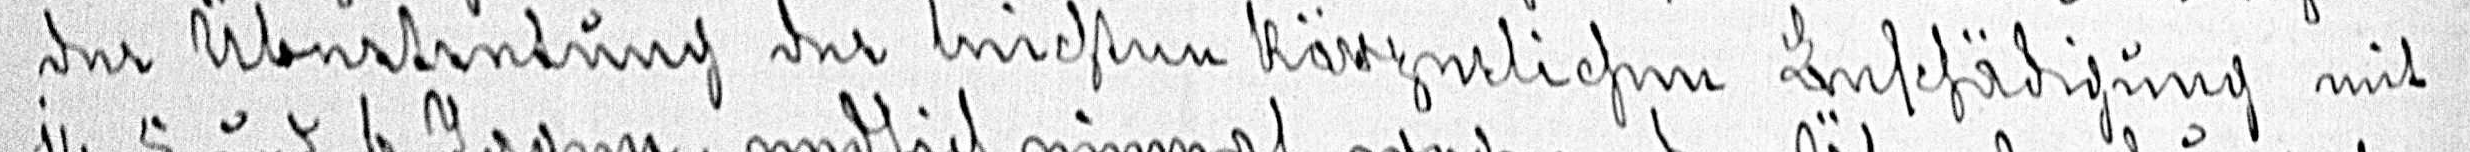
der Übertretung der leichten körperlichen Beschädigung mit
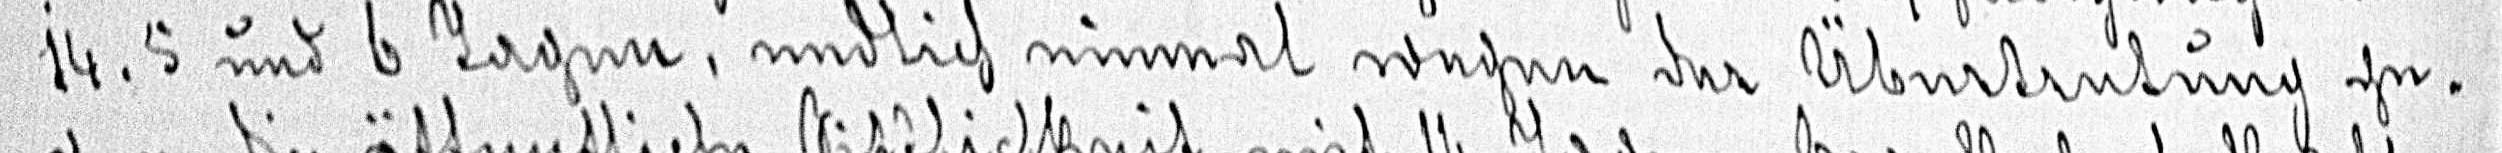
14, 5 und 6 Tagen, endlich einmal wegen der Übertretung ge¬
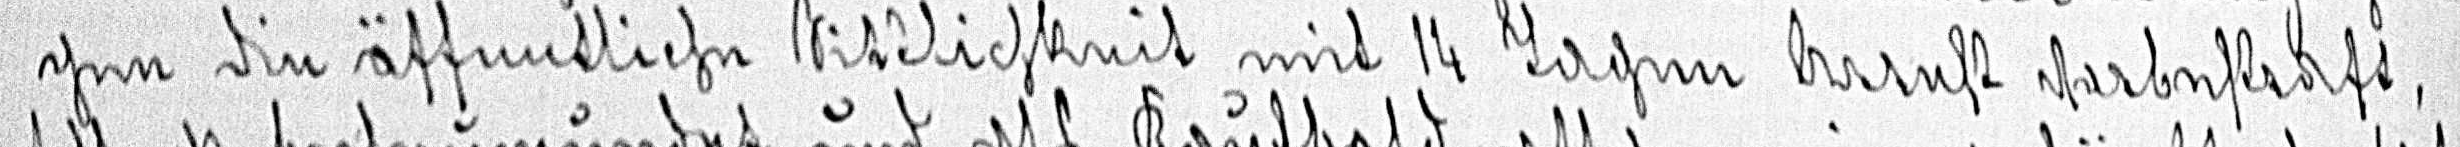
gen die öffentliche Sittlichkeit mit 14 Tagen Arrest vorbestraft,
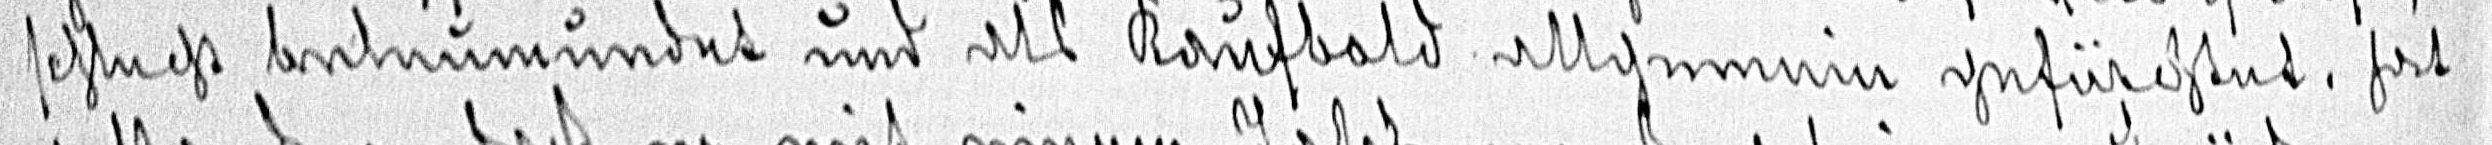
schlecht beleumundet und al Raufbold allgemein gefürchtet, hat
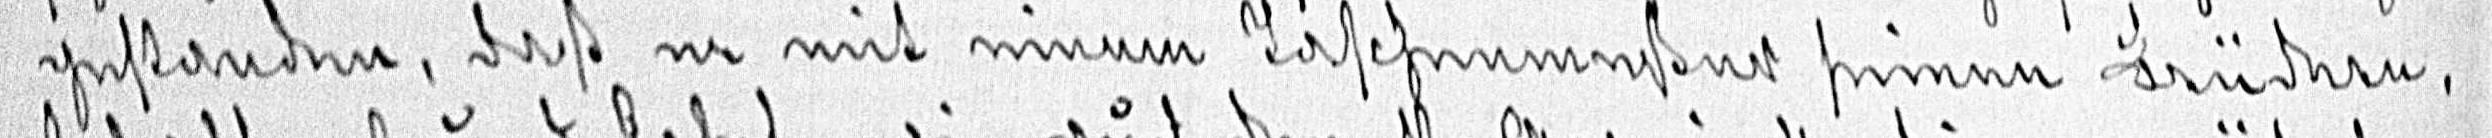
gestanden, daß er mit einem Taschenmesser seinen Brüdern,
